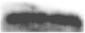一
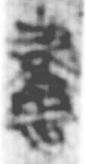○（畫）
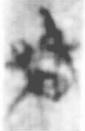○（伐）
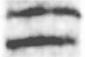二
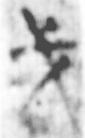戈
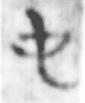屯
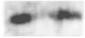一
